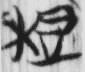梪
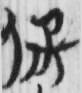保
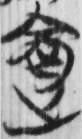○（逾）
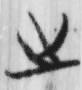之
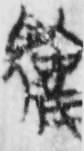觀
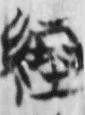綳
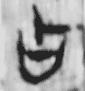占
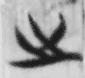之
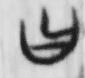曰
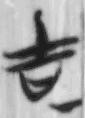吉
